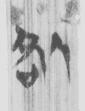咎
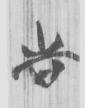告
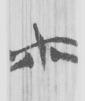尒
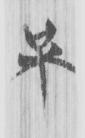某
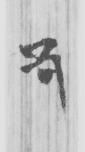邑
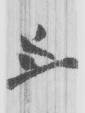之
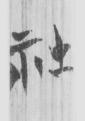社
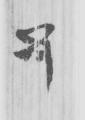邑
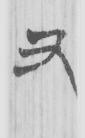又
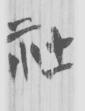社
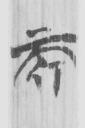而
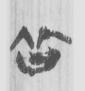向
